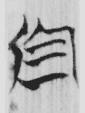於
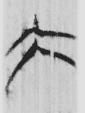大
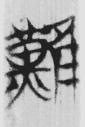難
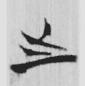之
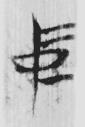𠁩
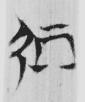凥
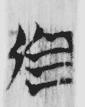於
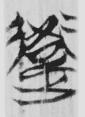{衛止}
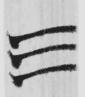三
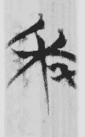年
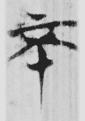不
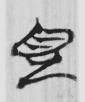見
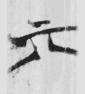亓
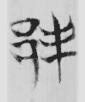邦
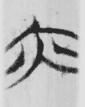亦
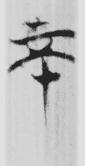不
